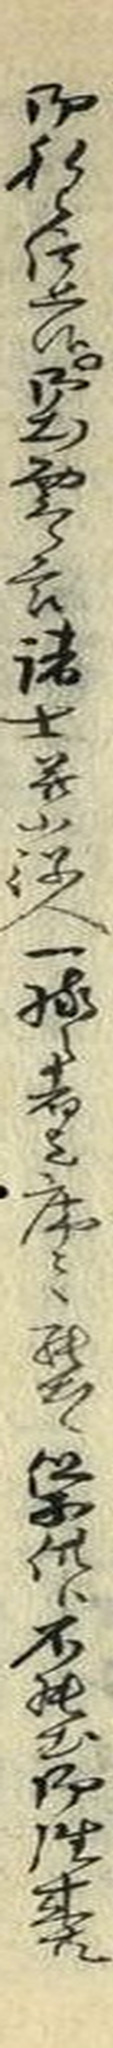御礼被仰上候〇御出殿之節諸士幷小役人一統之者迄席々へ罷出候但子供ハ不罷出御往来共
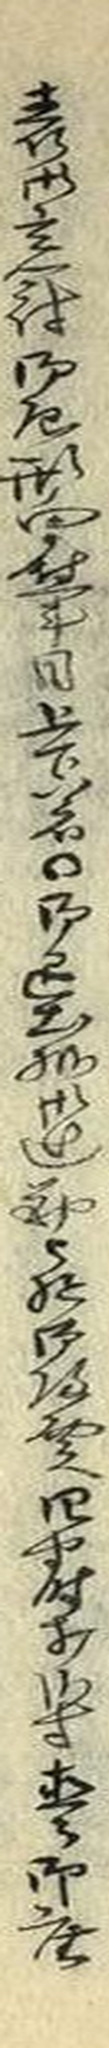表御玄冠御屋形向熨斗目上下着〇御退出掛御廻勤被遊御帰殿四半時打弐寸直ニ御座
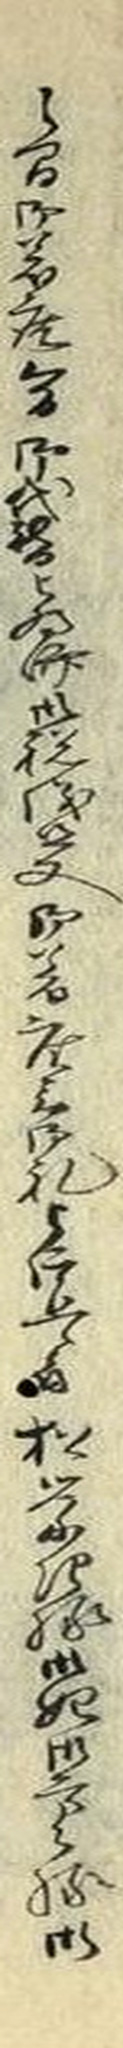之間御着座今日御代替被為済御祝儀且又御着座ニ而御礼被仰上候ニ付松栄院様御始御方々様御
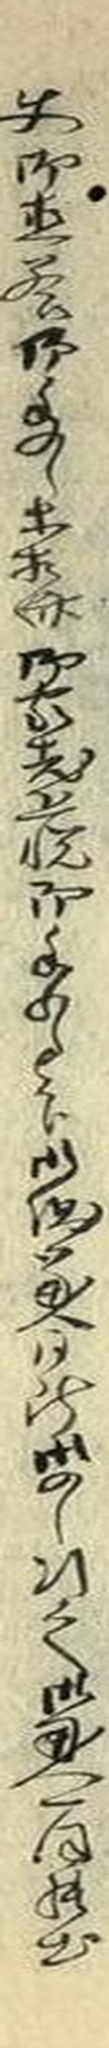使御直答御手のし等相済御家老恐悦御手のし被下御側御用人同断御手のし引之御用人一同罷出
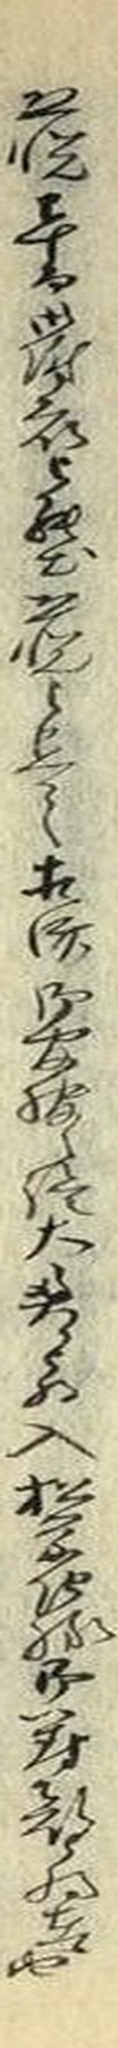恐悦畢而御附衆被罷出恐悦被申上之相済御官服之儘大奥へ被為入松栄院様御対顔被為在候由
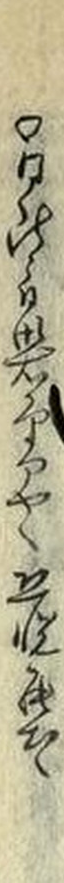〇同断ニ付御右筆部屋へ恐悦罷出候
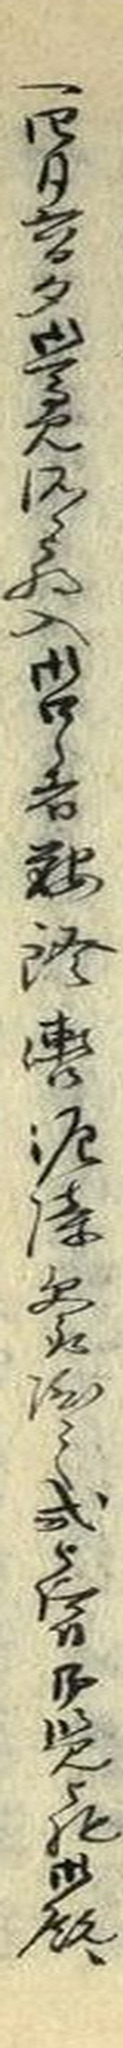一四月六日夕御馬見所へ被為入御口之者鞍鐙轡泥障受取渡之式被仰付御覧被遊御厩へ
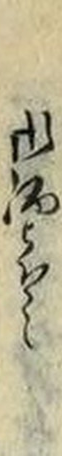御酒被下之
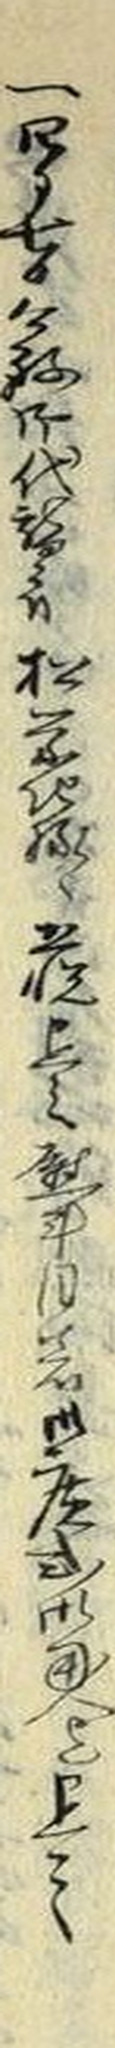一四月七日今般御代替ニ付松栄院様へ恐悦申上之熨斗目着御広式御用人迄申上之
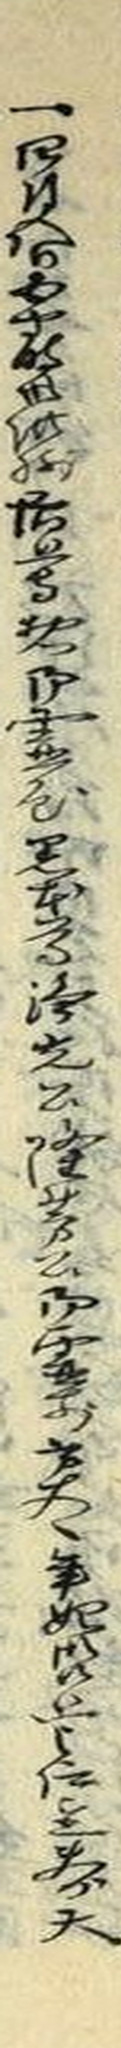一四月八日五半時御供揃増上寺惣御霊屋黒本尊浄光公隆芳公御霊前方丈へ年始御口上被仰置夫ゟ天
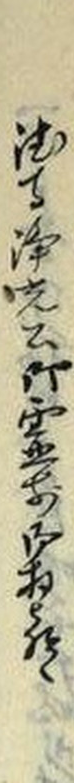徳寺浄光公御霊前御拝被遊候
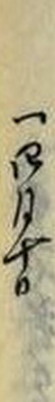一四月十日
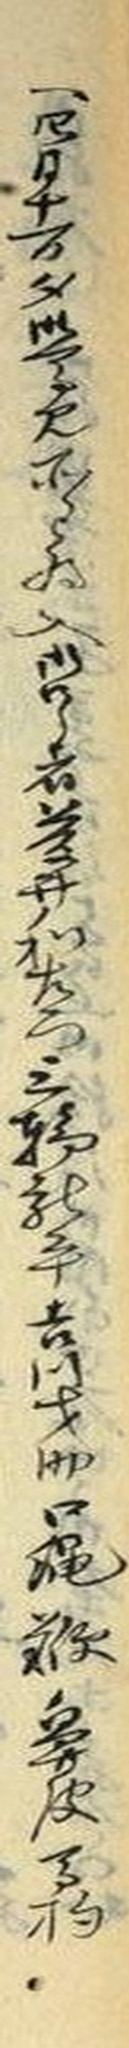一四月十一日夕御馬見所へ被為入御口之者藤井利左衛門三輪新平吉川才助口縄鞭鼻皮馬杓
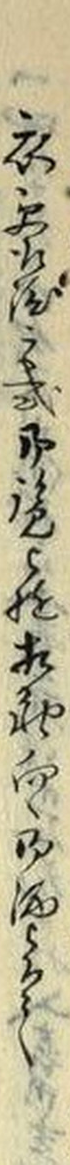衣受取渡之式御覧被遊相勤候向へ御酒被下之
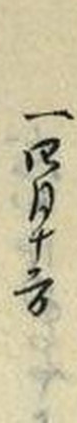一四月十二日
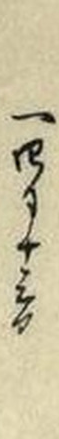一四月十三日
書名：少傅日録抄（斉善付側向頭取日記、在府）
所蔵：福井県文書館 Fukui Prefectural Archives
